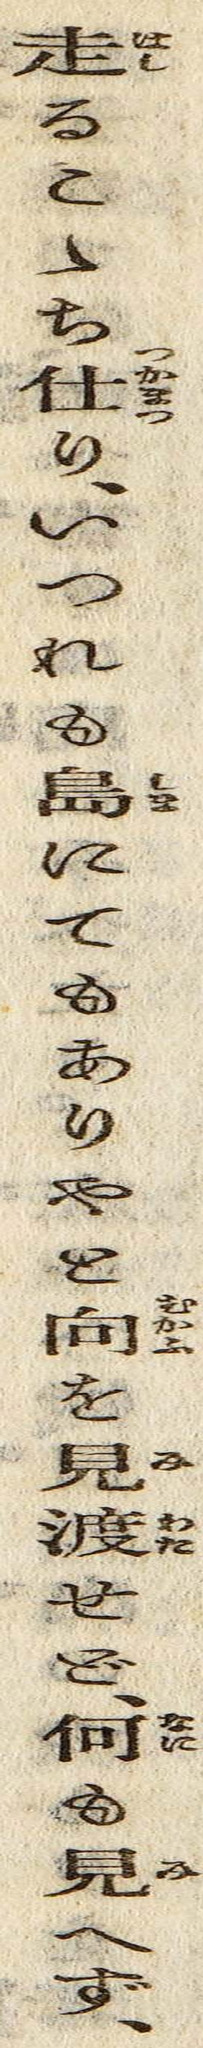走るこゝち仕り、いつれも島にてもありやと向を見渡せど、何も見へず、
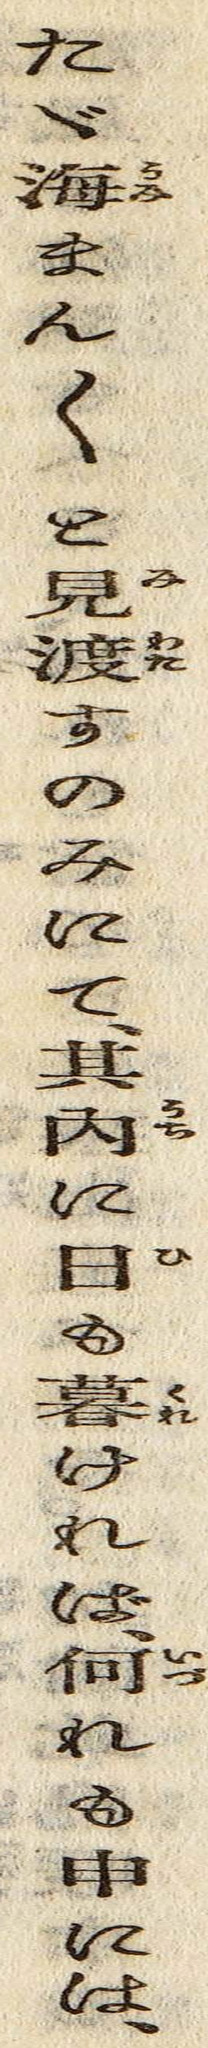たヾ海まん〳〵と見渡すのみにて、其内に日も暮ければ、何れも申には、
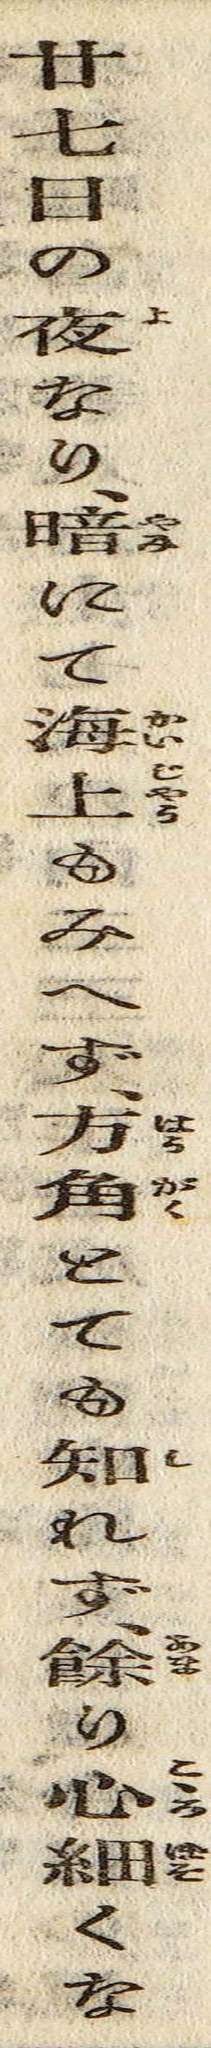廿七日の夜なり、暗にて海上もみへず、方角とても知れず、余り心細くな
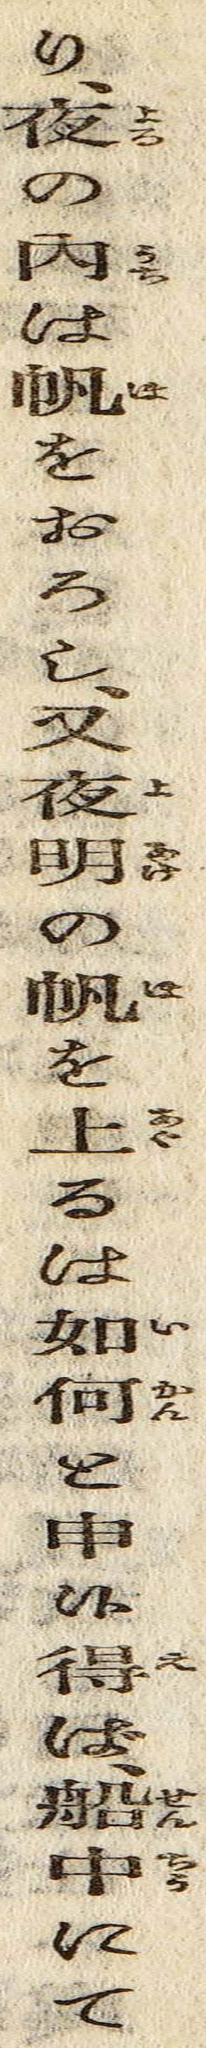り、夜の内は帆をおろし、又夜明の帆を上るは如何と申候得ば、船中にて
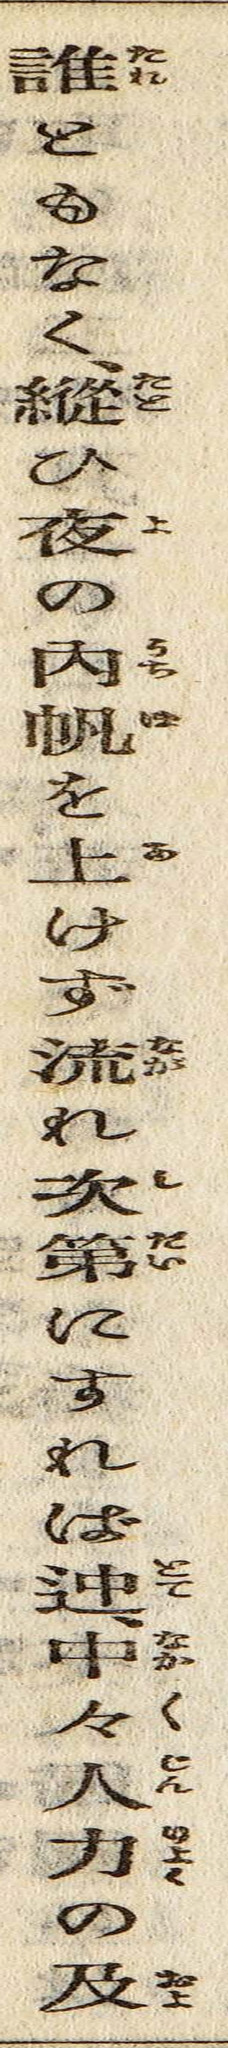誰ともなく、縦ひ夜の内帆を上けず流れ次第にすれば迚、中々人力の及
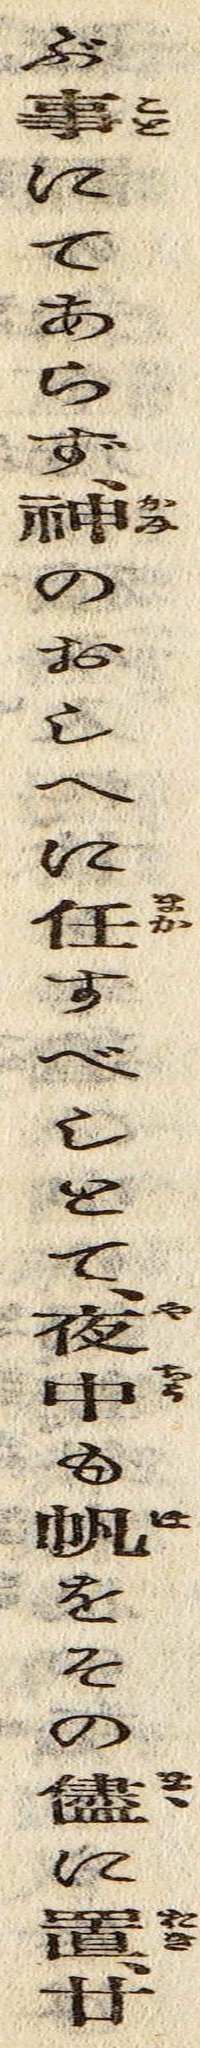ぶ事にてあらず、神のおしへに任すべしとて、夜中も帆をその儘に置、廿
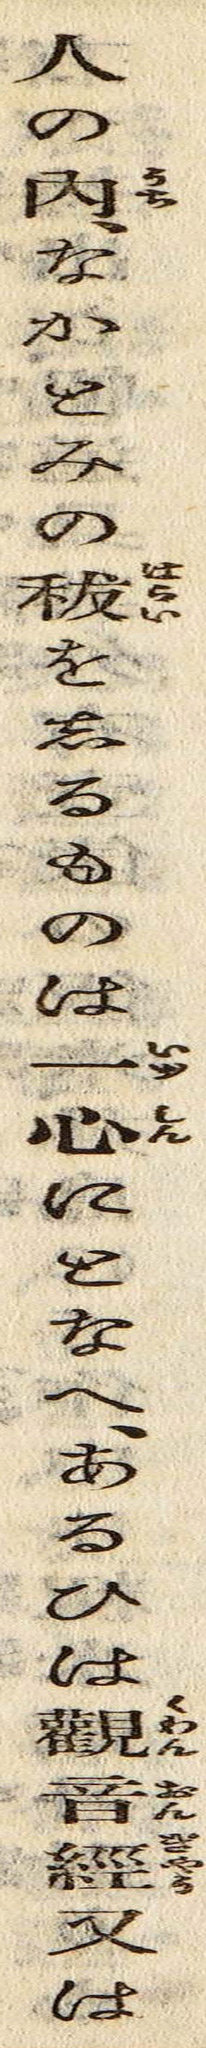人の内、なかとみの祓をしるものは一心にとなへ、あるひは観音経又は
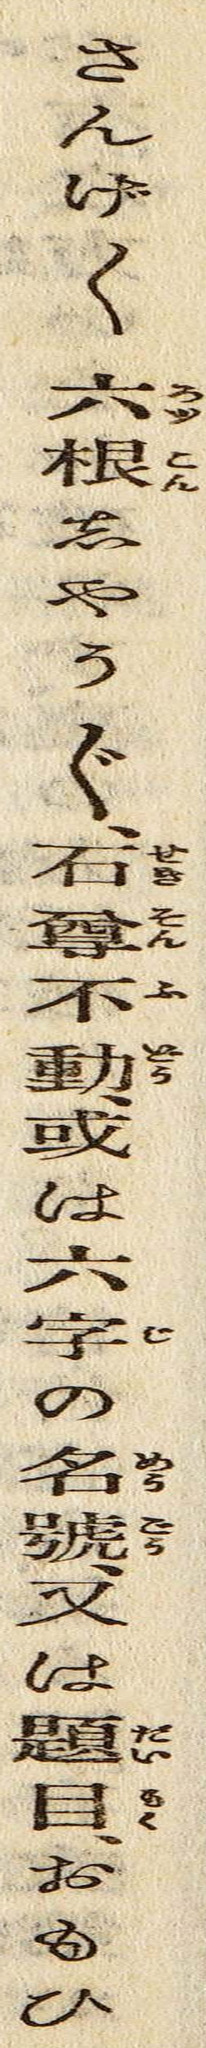さんげ〳〵六根しやう〴〵、石尊不動、或は六字の名号、又は題目、おもひ
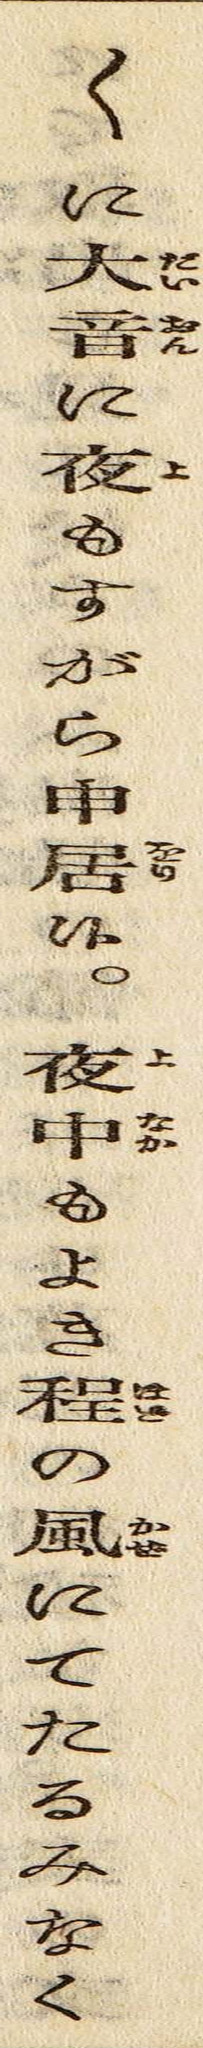〳〵に大音に夜もすがら申居候。夜中もよき程の風にてたるみなく
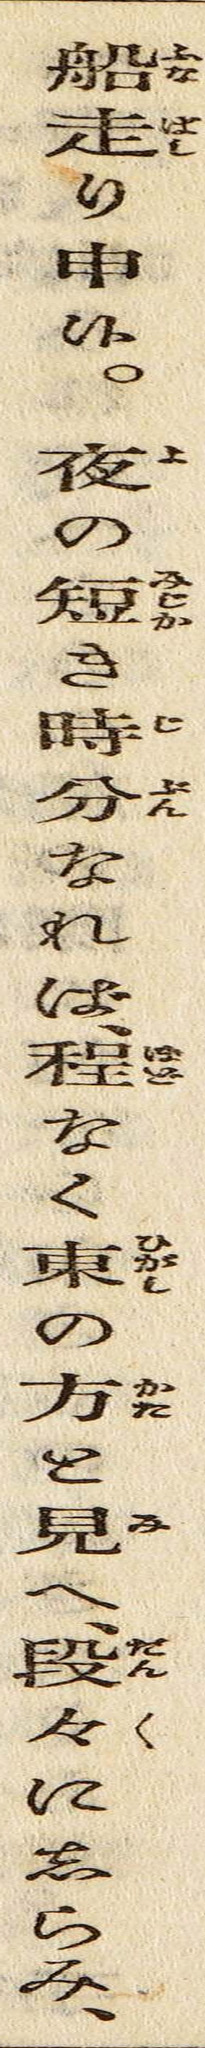船走り申候。夜の短き時分なれば、程なく東の方と見へ、段々にしらみ、
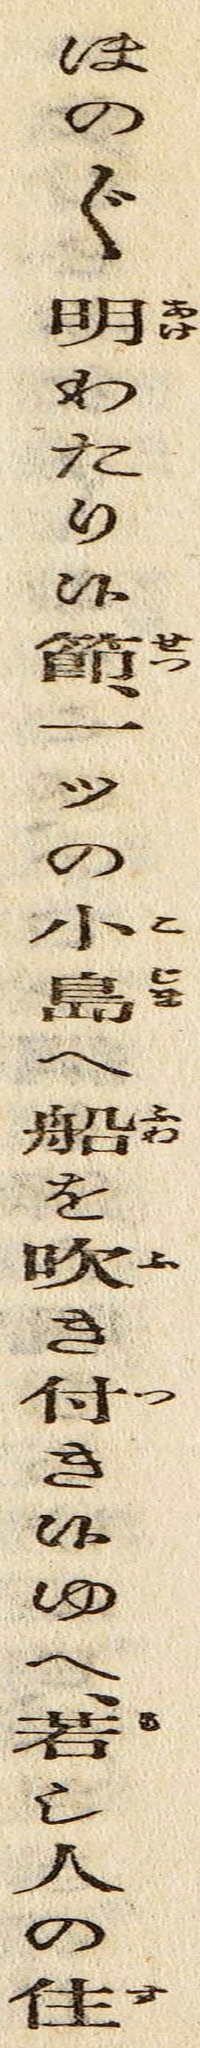ほの〴〵明わたり候節、一ツの小島へ船を吹き付き候ゆへ、若し人の住
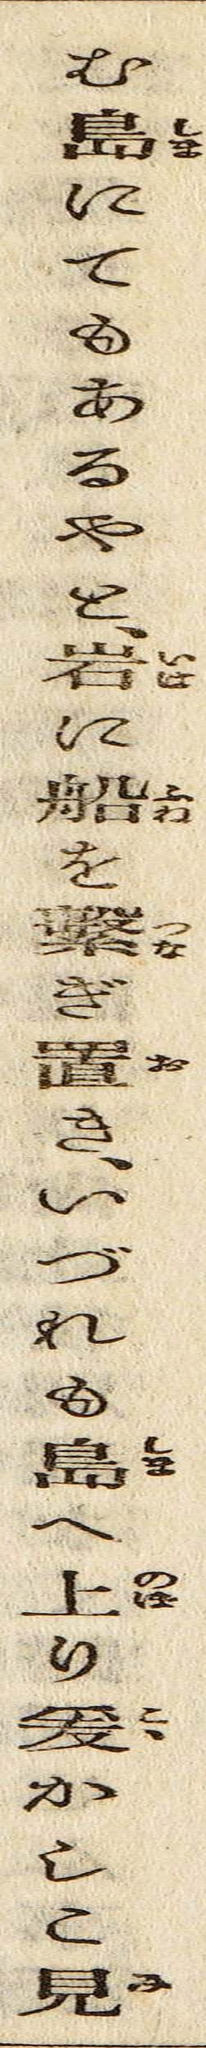む島にてもあるやと、岩に船を繫ぎ置き、いづれも島へ上り爰かしこ見
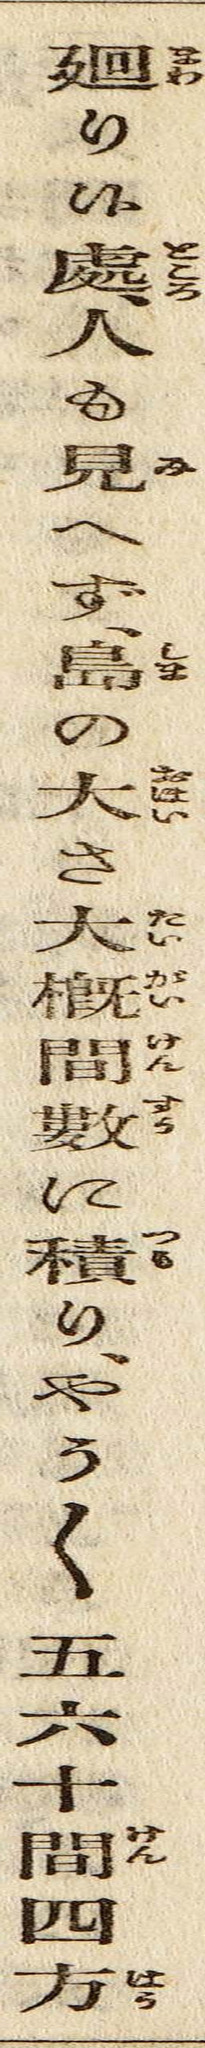廻り候処、人も見へず、島の大さ大概間数に積り、やう〳〵五六十間四方
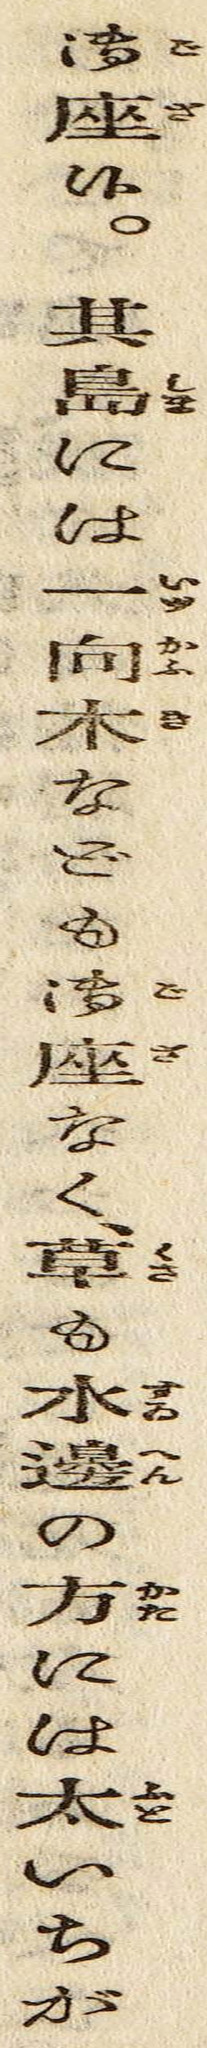御座候。其島には一向木なども御座なく、草も水辺の方には太いちが
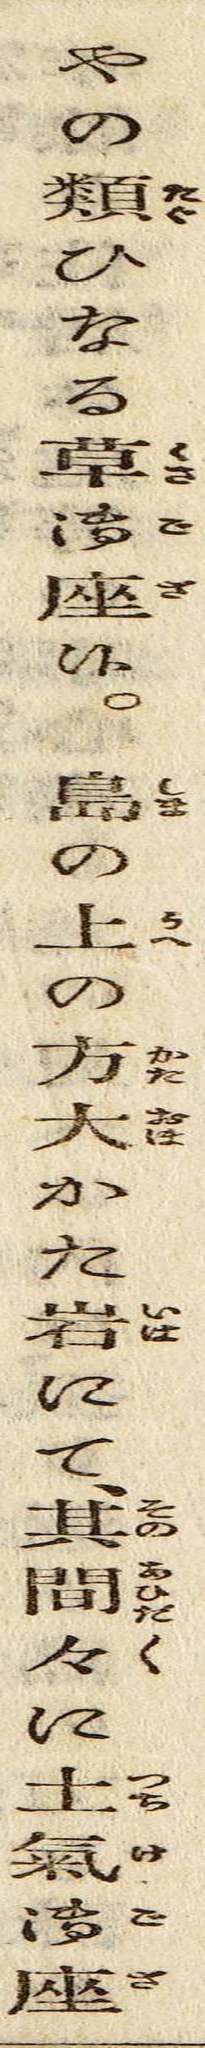やの類ひなる草御座候。島の上の方大かた岩にて、其間々に土気御座
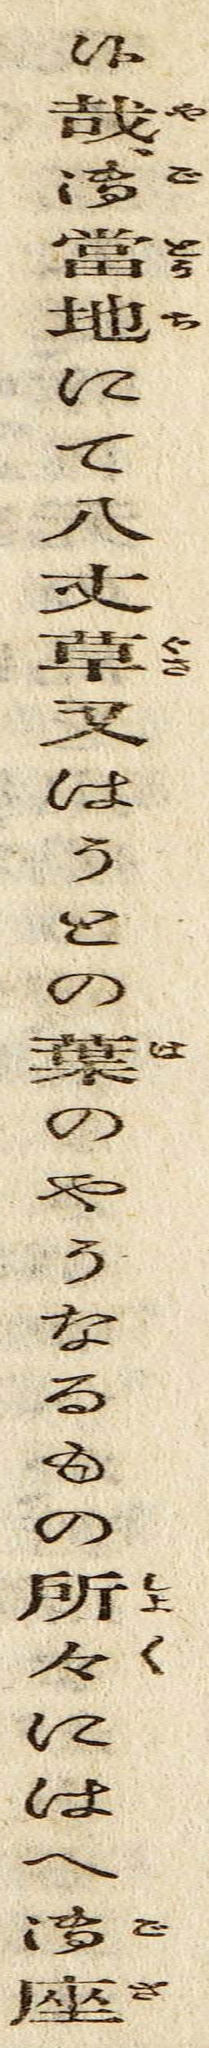候哉、御当地にて八丈草又はうとの葉のやうなるもの所々にはへ御座
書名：日本漂流譚
